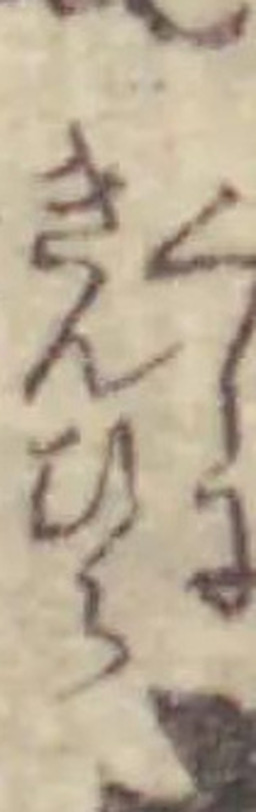きんひら
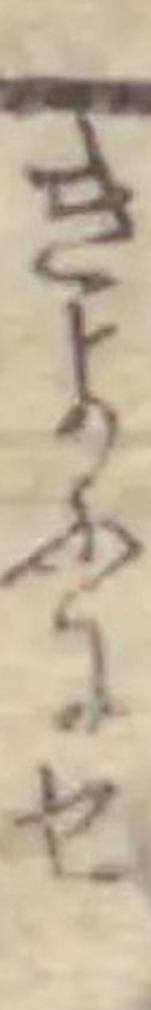きよふにせ
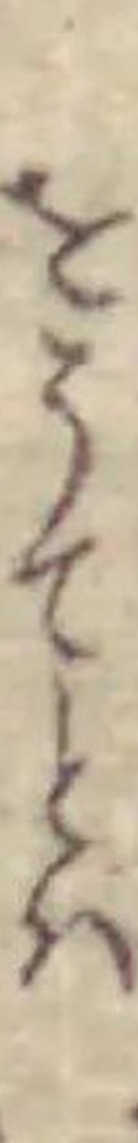をうてとは
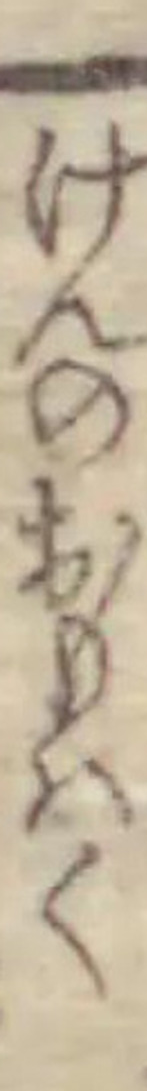けんのおもはく
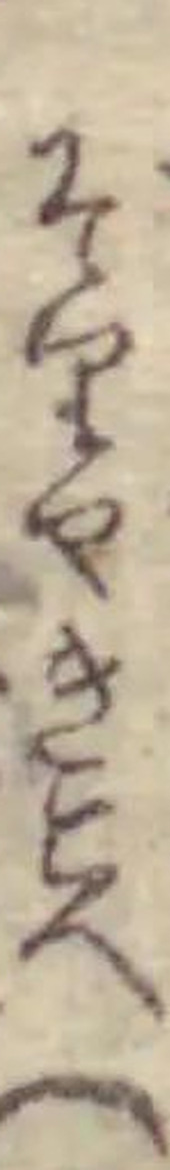そりやきこへ
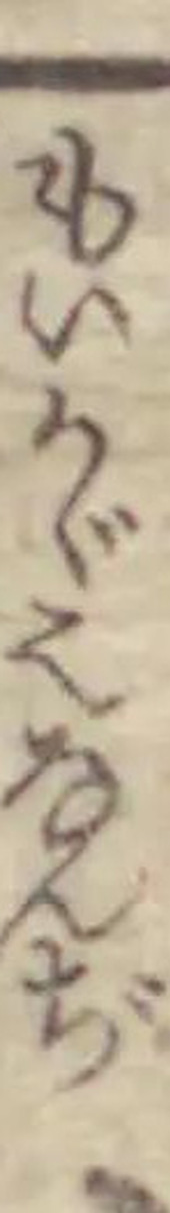もいかゞ也なんぢ
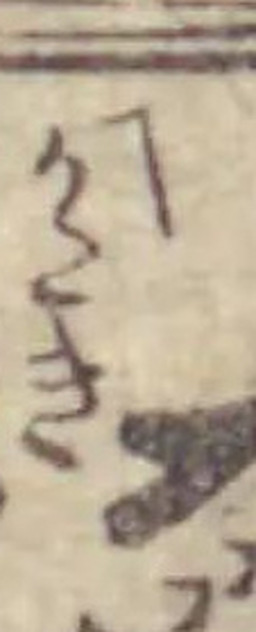〽かたき
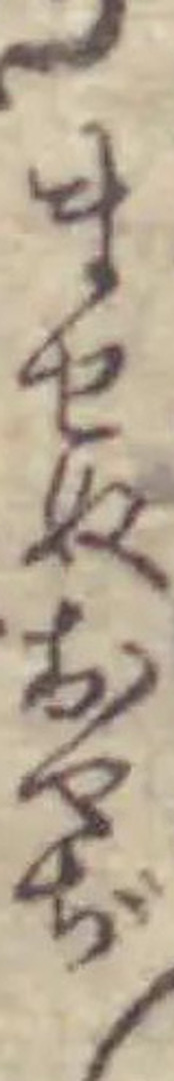ませぬおやぢ
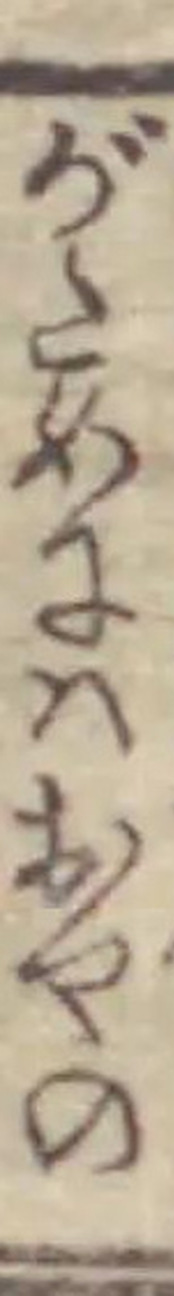がためにはおやの
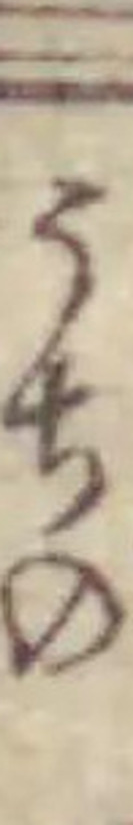うちの
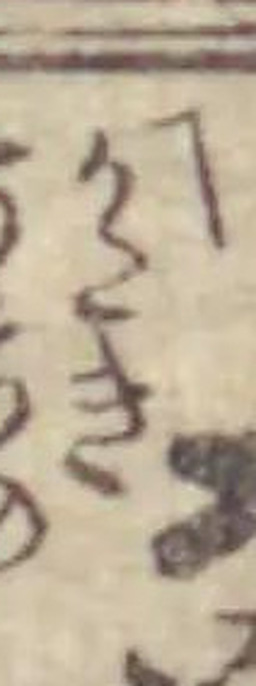うちの
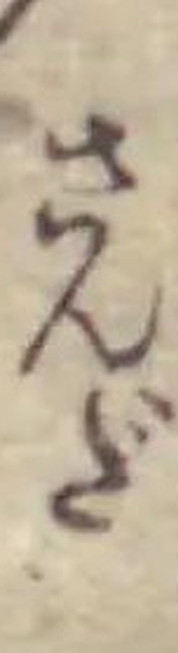さんだ
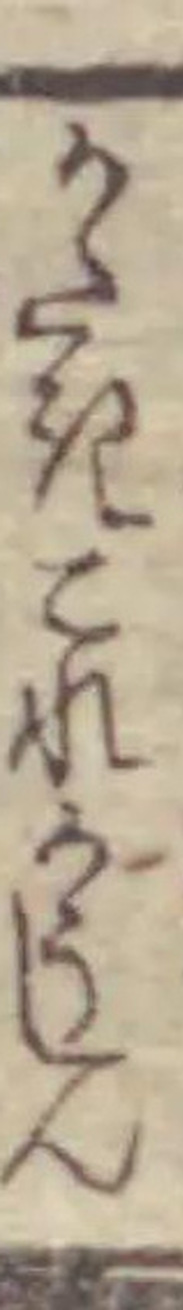かたきこれかうしん
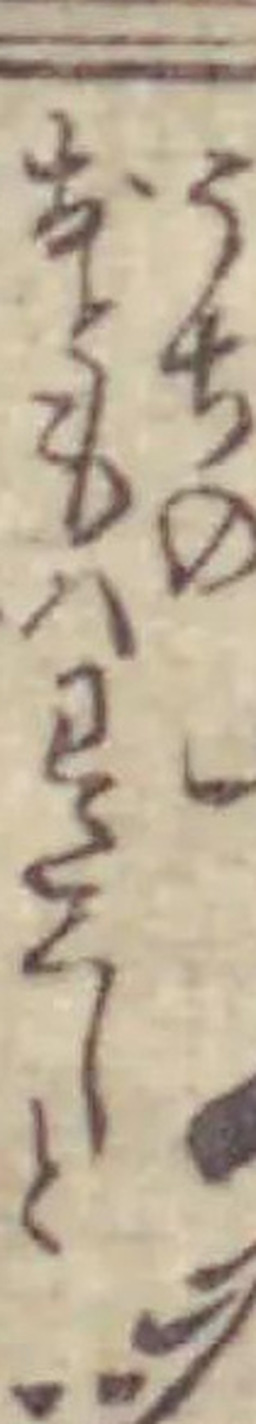おともはわたくしと
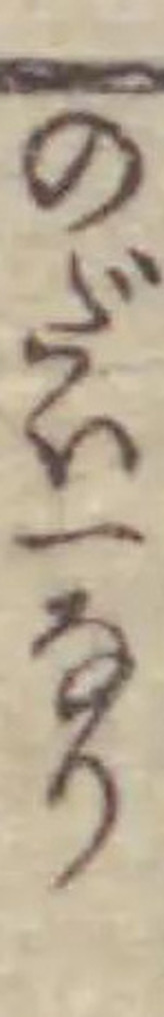のだい一なり
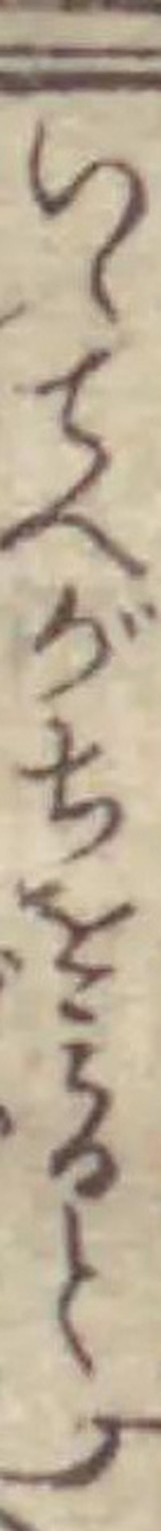いゝてへがちをみると
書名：化物敵討 2巻
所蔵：国立国会図書館 National Diet Library, JAPAN
